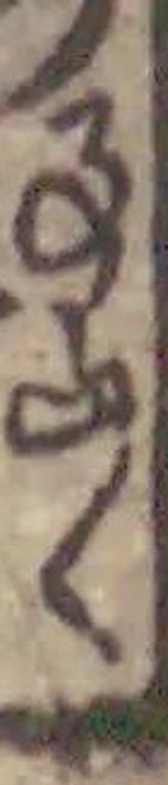事山〳〵
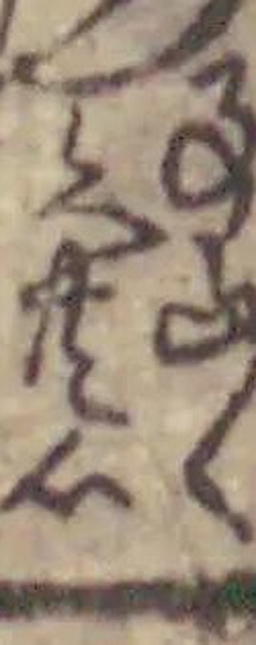候へ共心
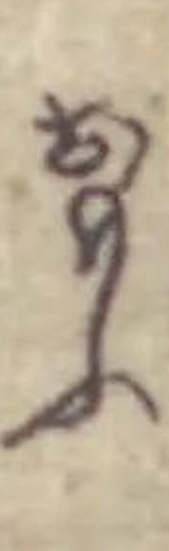おもふ
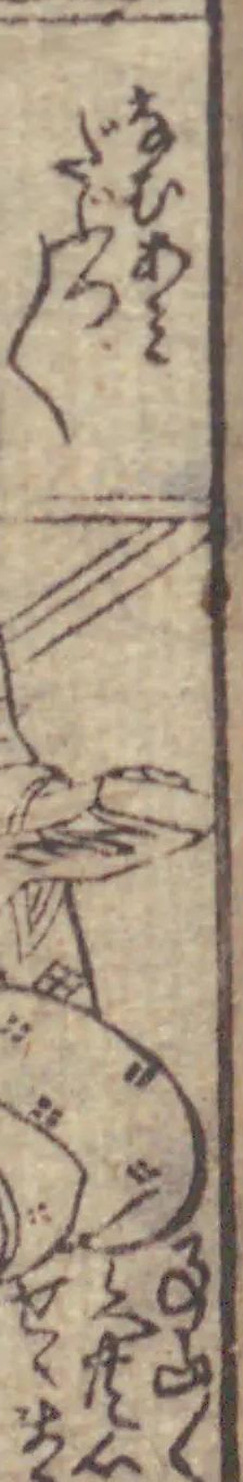なむあみ
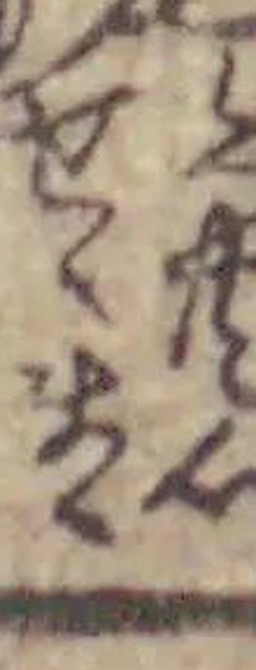せくまゝ
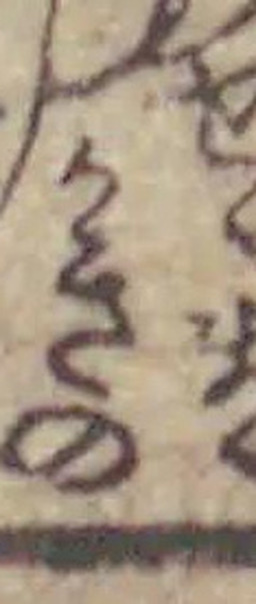かきの
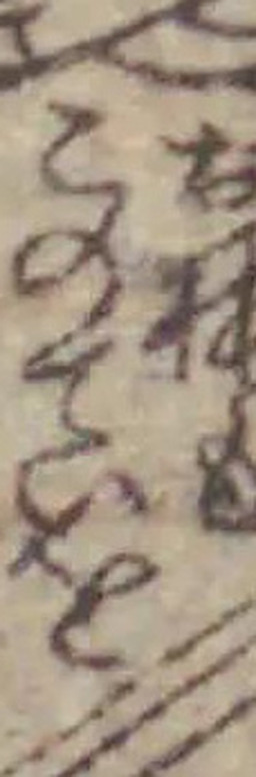このていを
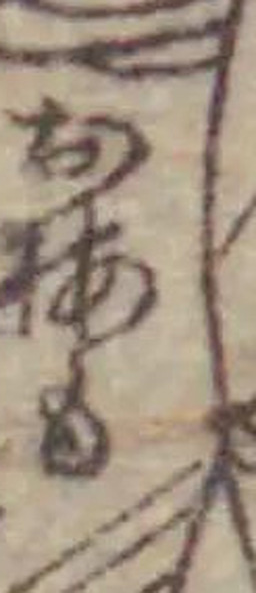お梅も
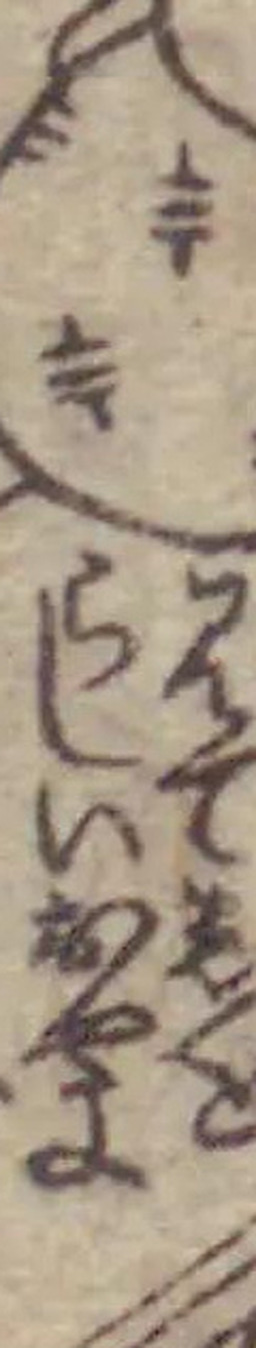らしいおやに
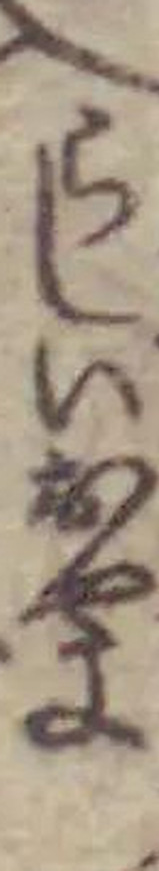らしいおやに
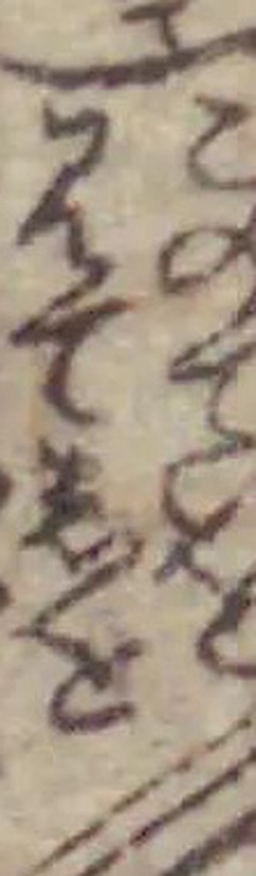見てしを
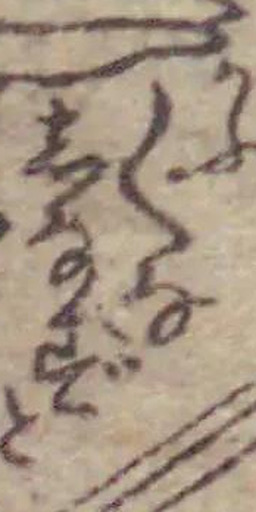しなずと
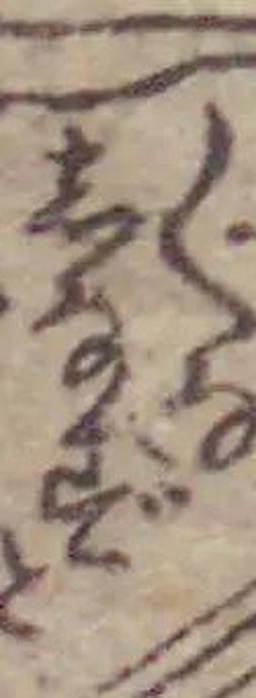しなずと
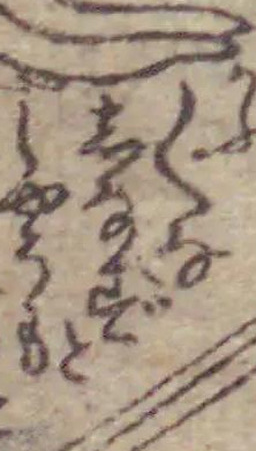しなずと
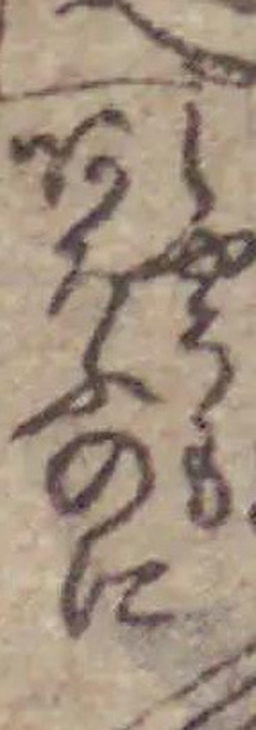あろふのに
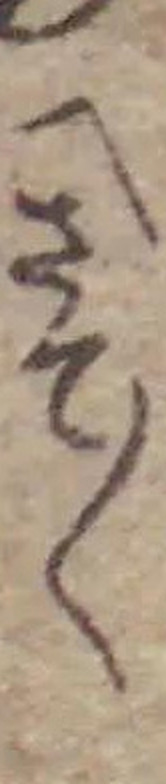〽さて〳〵
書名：桃太郎元服姿 2巻
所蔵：国立国会図書館 National Diet Library, JAPAN
